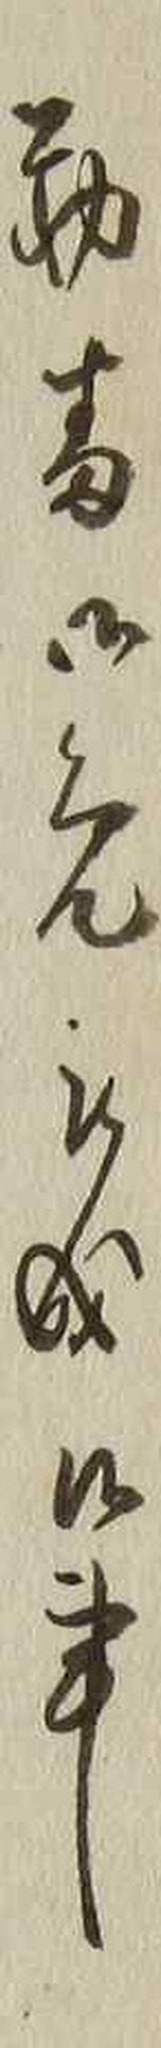勤番御免被成候事
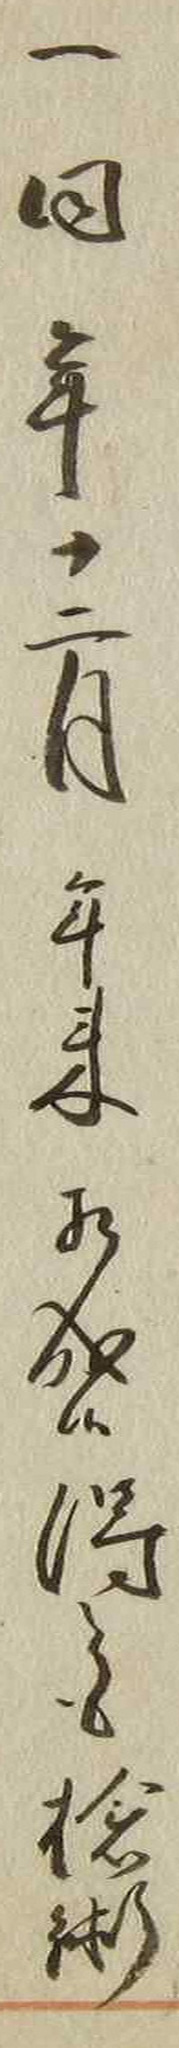一同年十二月年来相成候得とも槍術
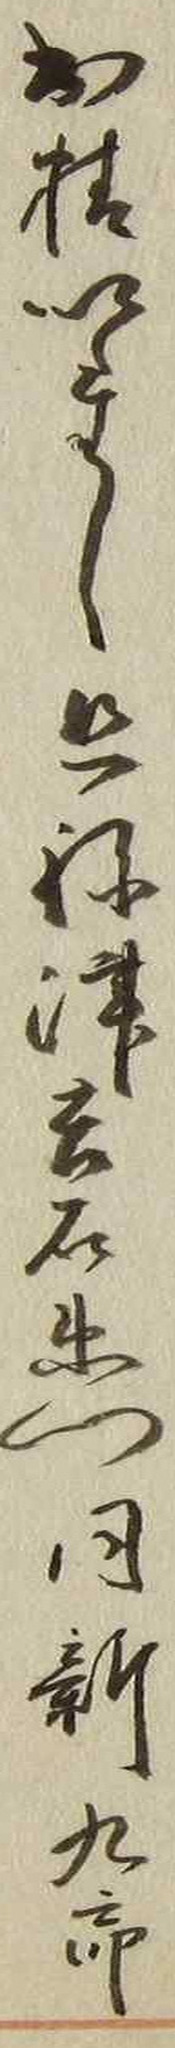出精いたし且祢津吉石衛門同新九郎
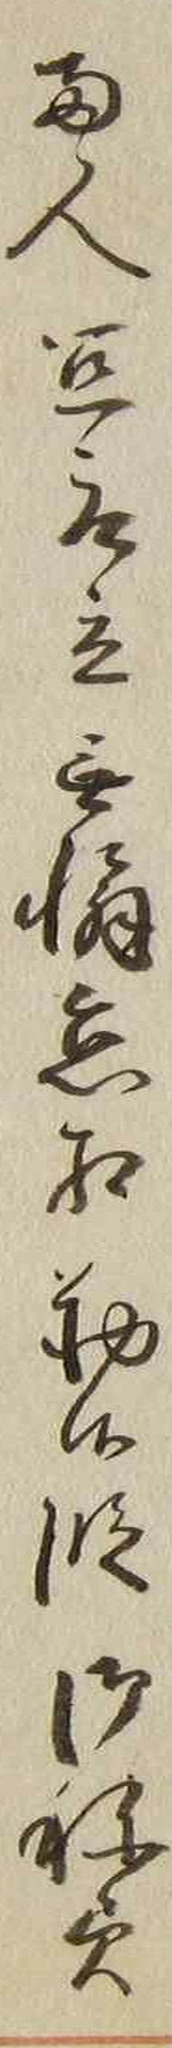両人宜取立無懈怠相勤候段御称美
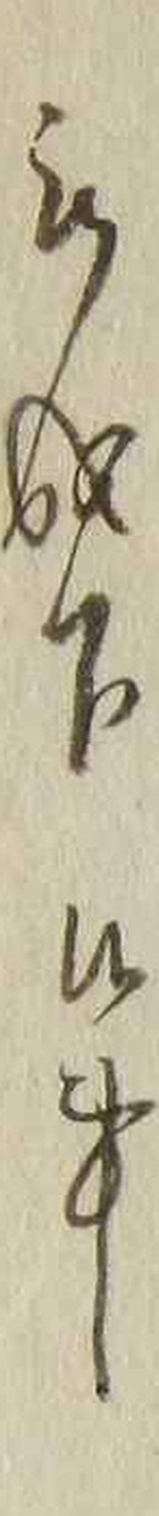被成下候事
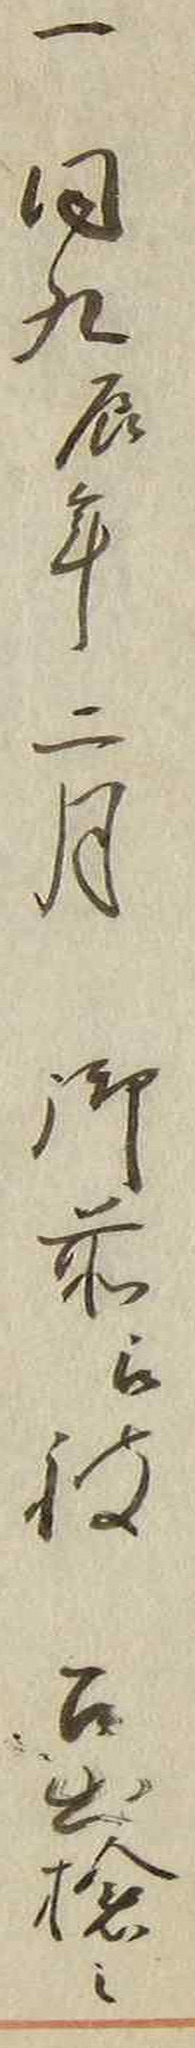一同九辰年二月御前江被召出槍之
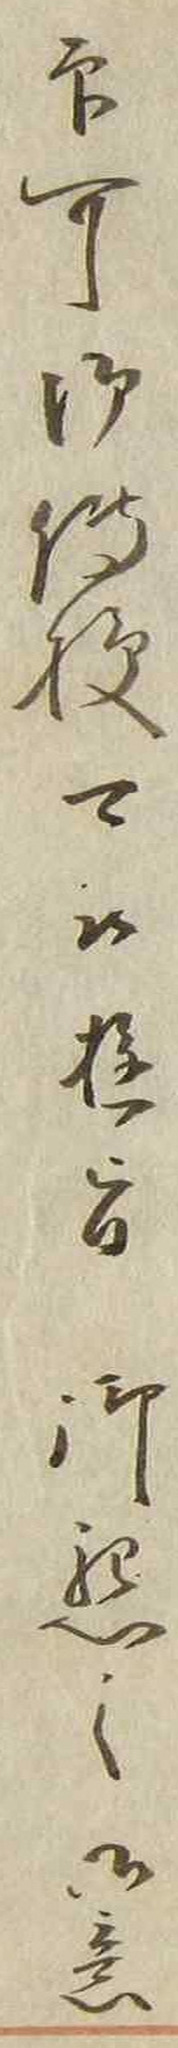印可御伝授可被遊旨御懇之御意

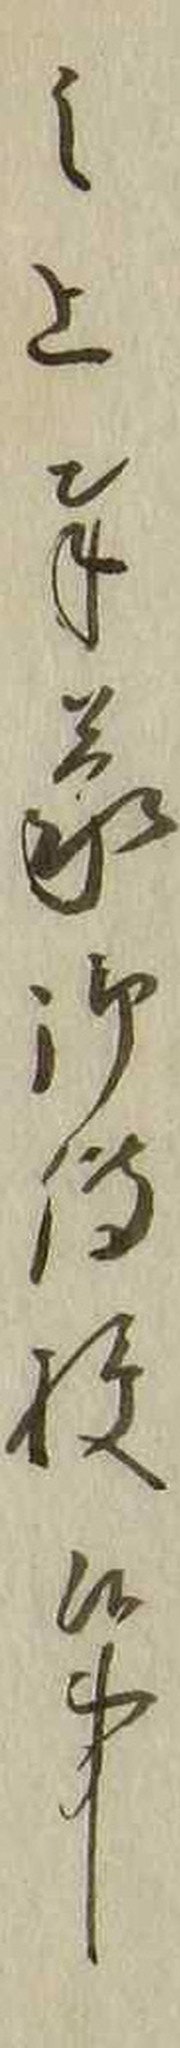之上奉承御伝授候事
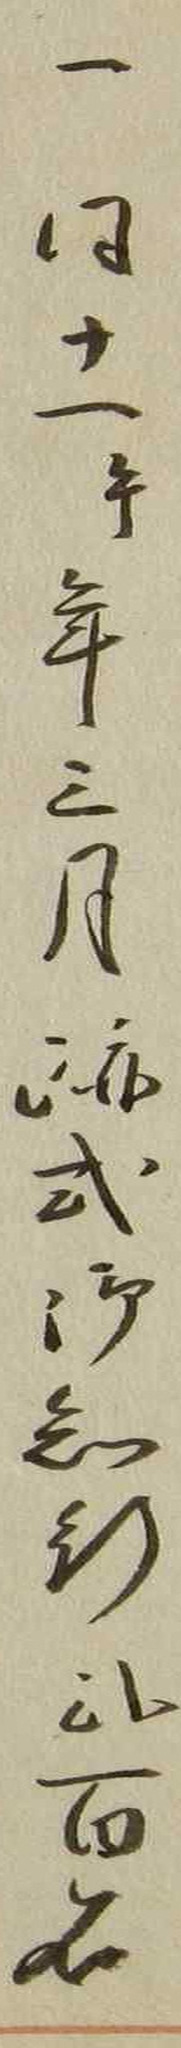一同十一午年三月跡式御知行弐百石
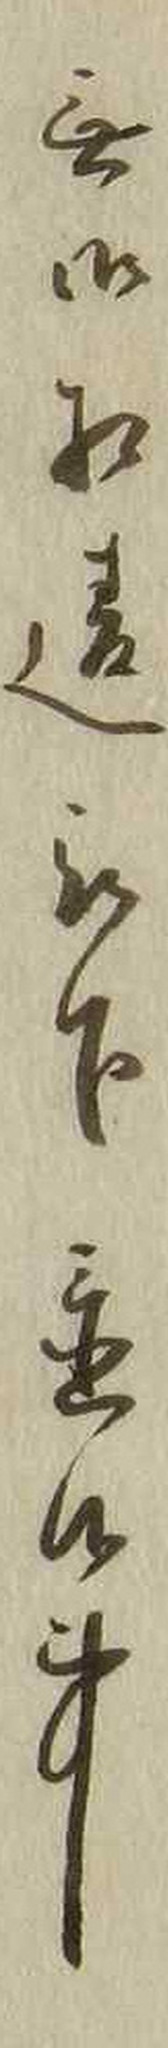無御相違被下置候事
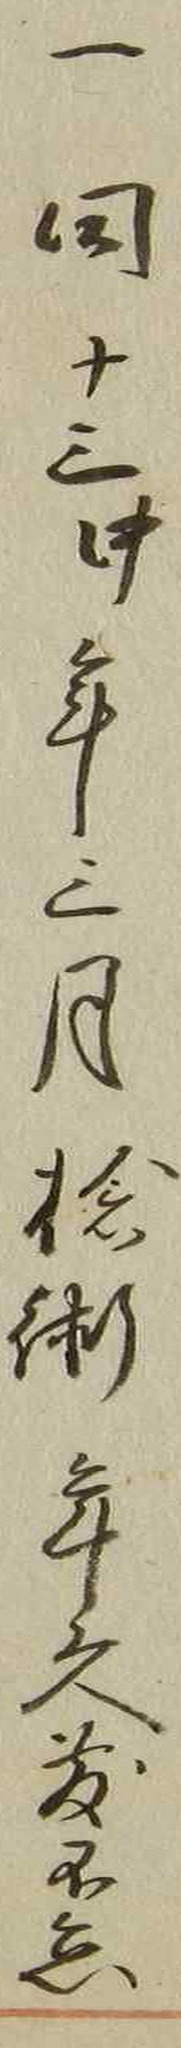一同十三申年三月槍術年久敷不怠
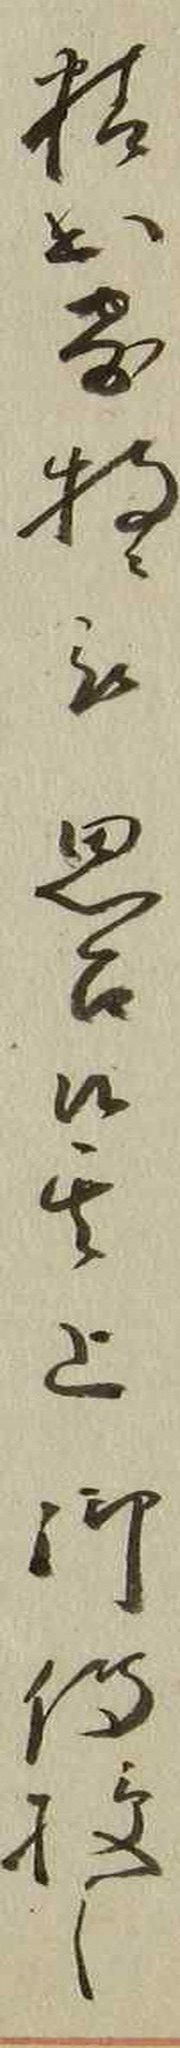精出奇特ニ被思召候其上御伝授之
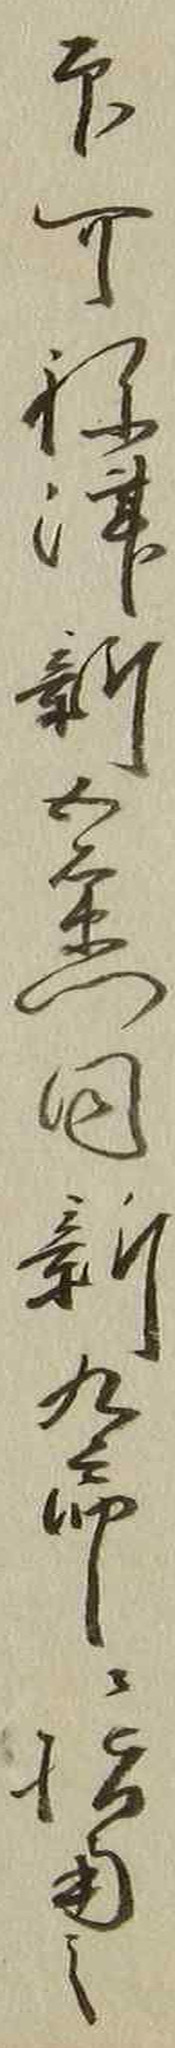印可祢津新五右衛門同新九郎ニ指南之
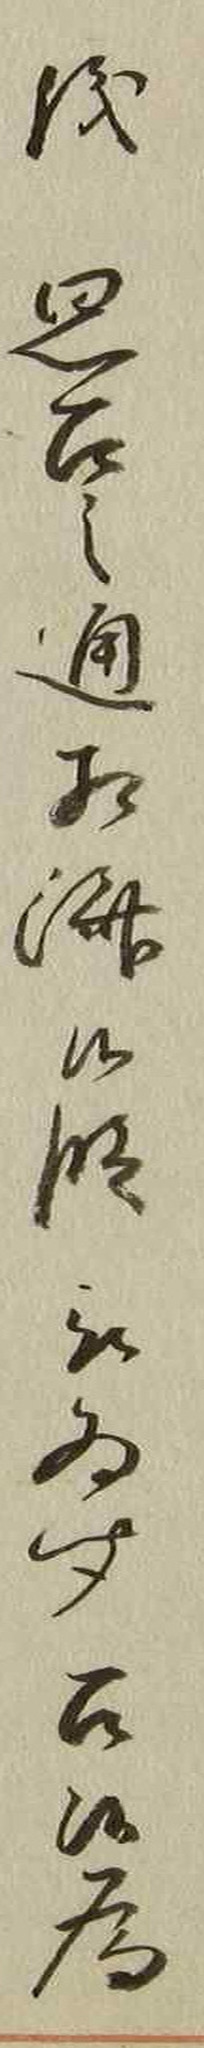儀思召之通相済候段被為聞召候為
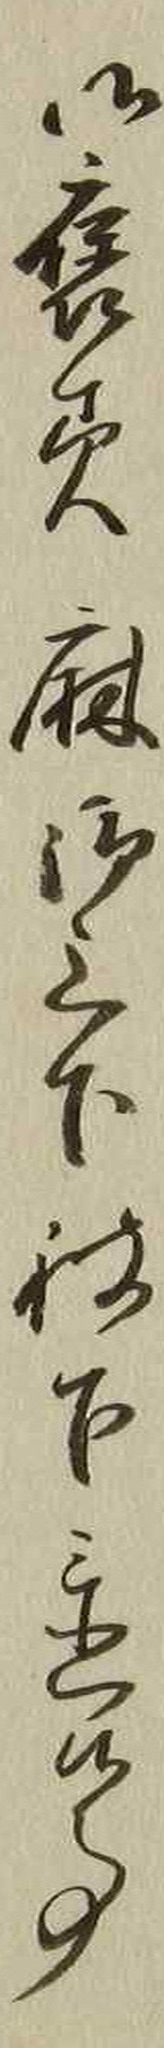御褒美麻御上下被下置候事
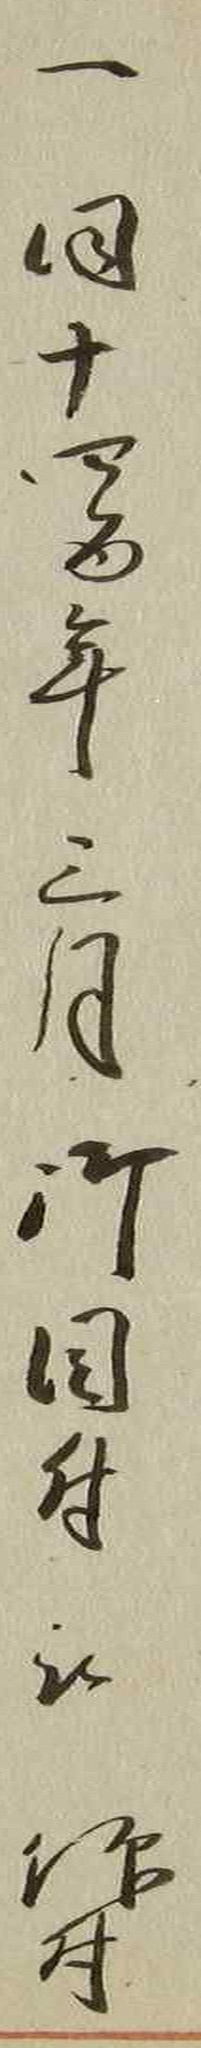一同十四酉年三月御目付被仰付
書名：諸士系譜　巻之122　よ之部5
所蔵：会津若松市立会津図書館
